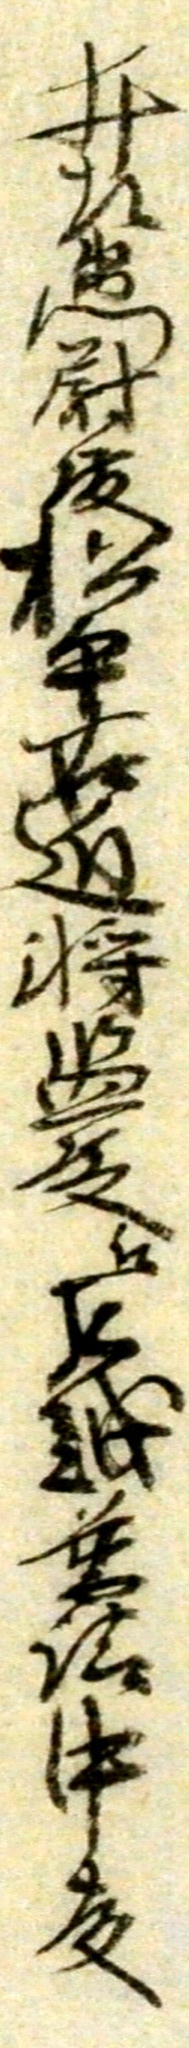井左衛門尉殿松平右近将監殿江罷越普請中殿
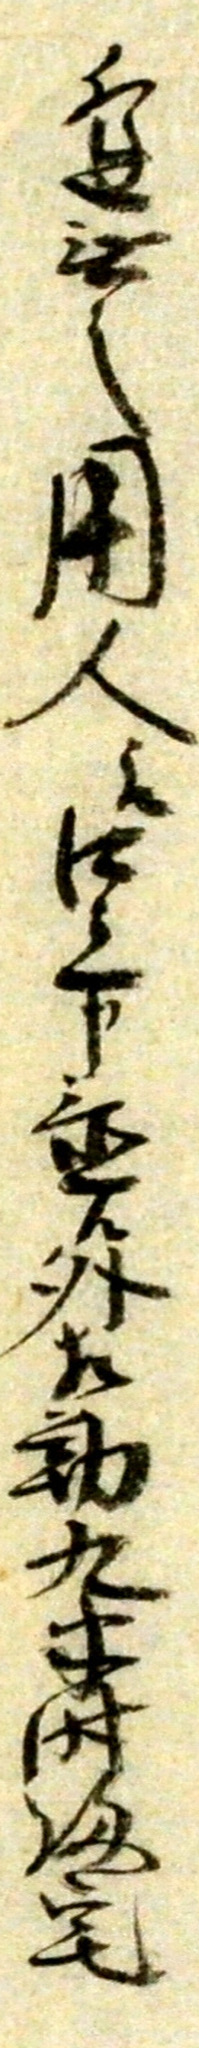逢無之用人江口上申置候外相勤九半時帰宅
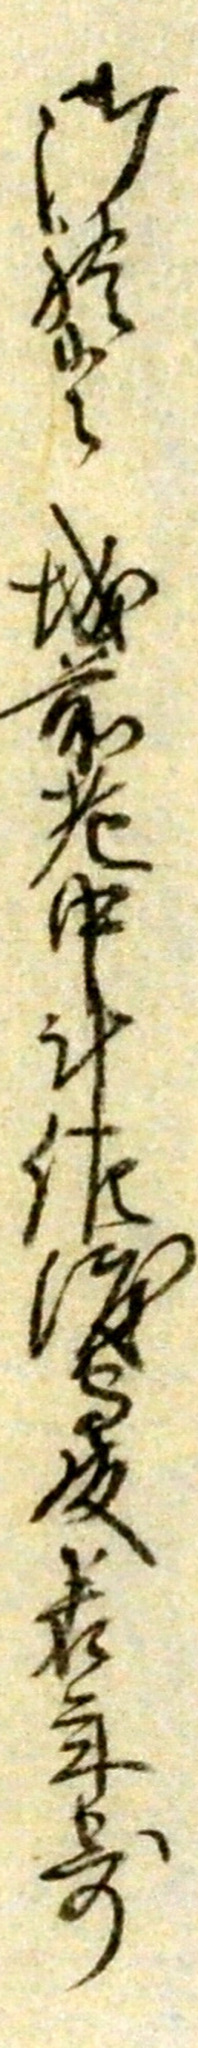御礼登城前老中計佐渡守殿若年寄
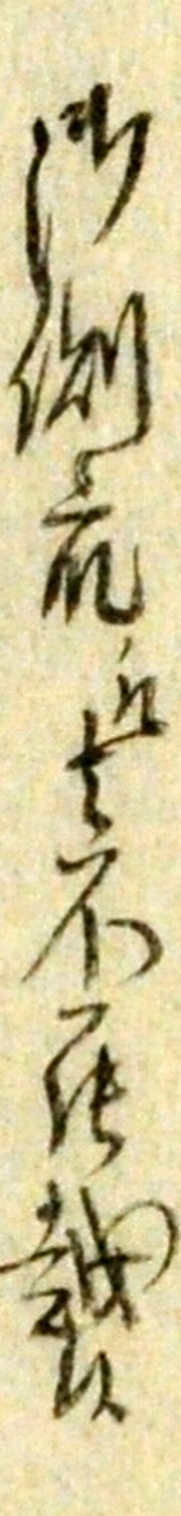御側衆江者不罷越候
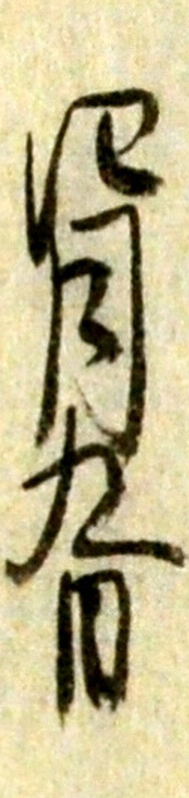四月九日
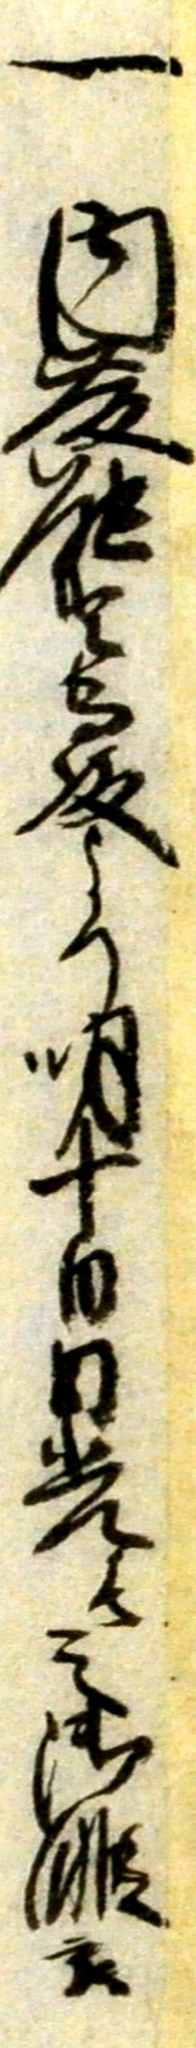一内藤能登守殿より明十日日光江之御暇被
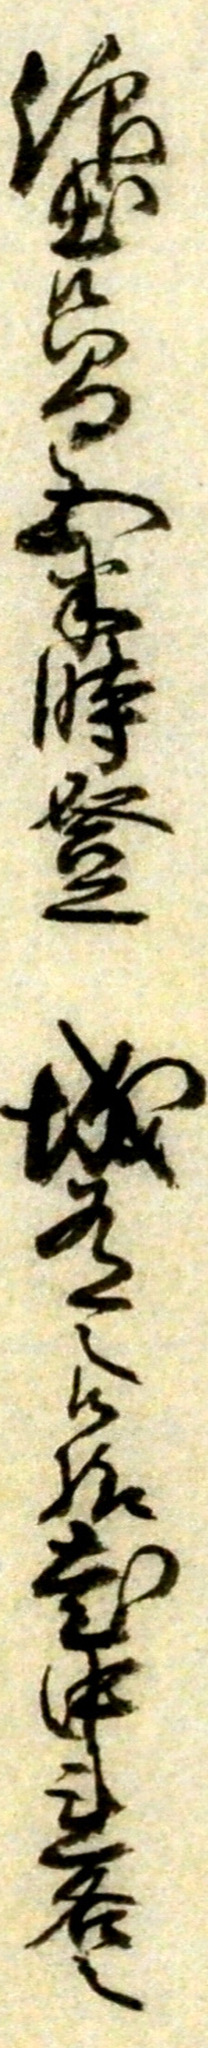仰出候間五半時登城有之候様老中連名之
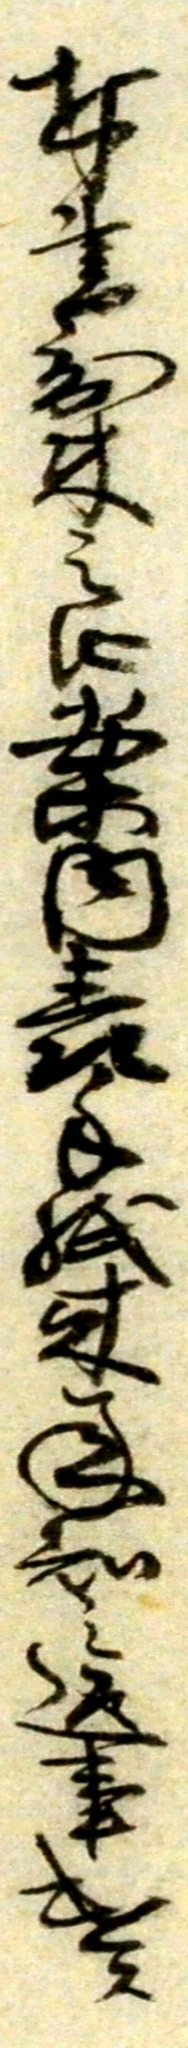奉書到来之由案内表手紙来承知之返事遣ス
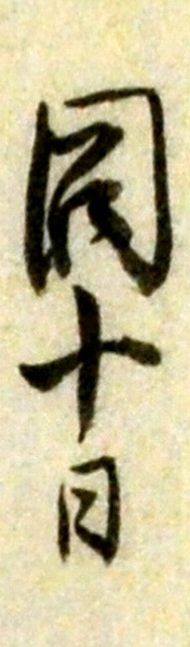同十日
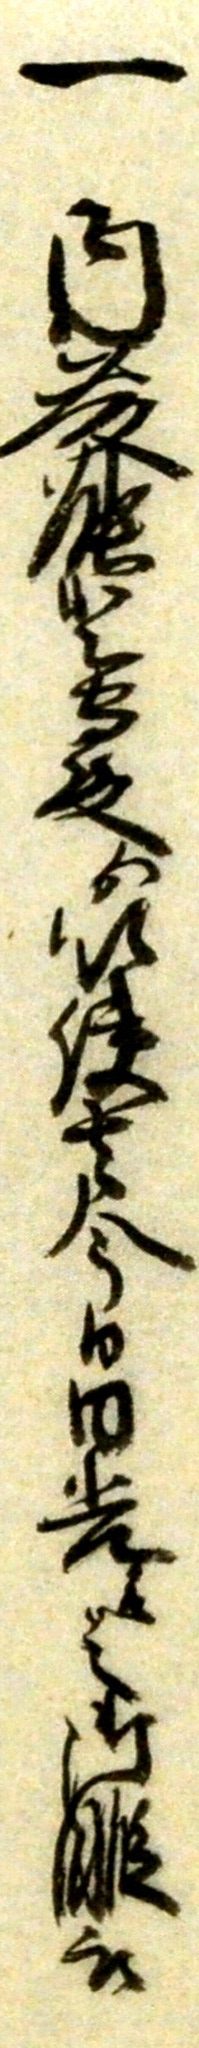一内藤能登守殿ゟ以使者今日日光江之御暇被
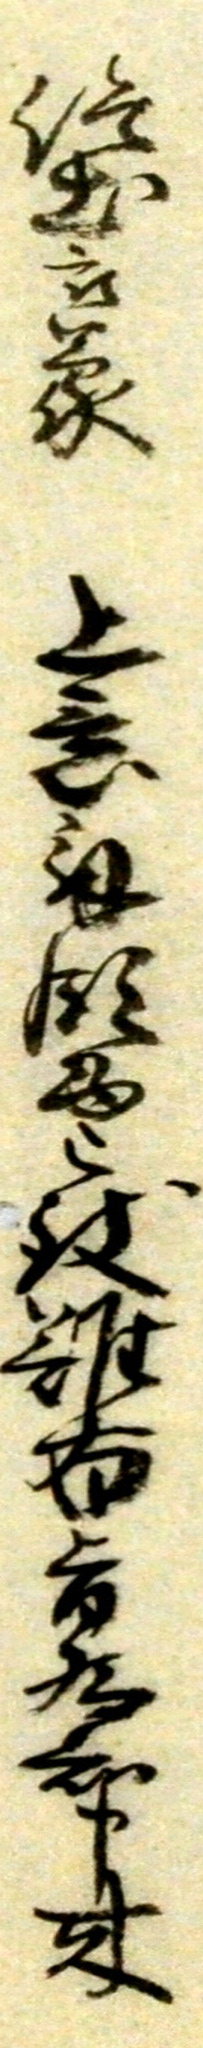仰出被蒙上意拝領品被致難有旨為知申来

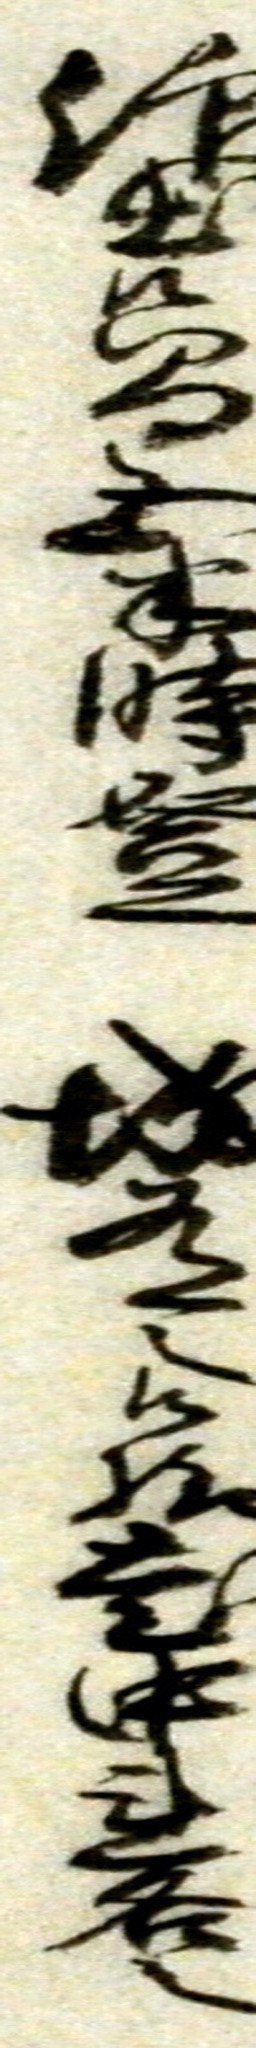仰出候間五半時登城有之候様老中連各々
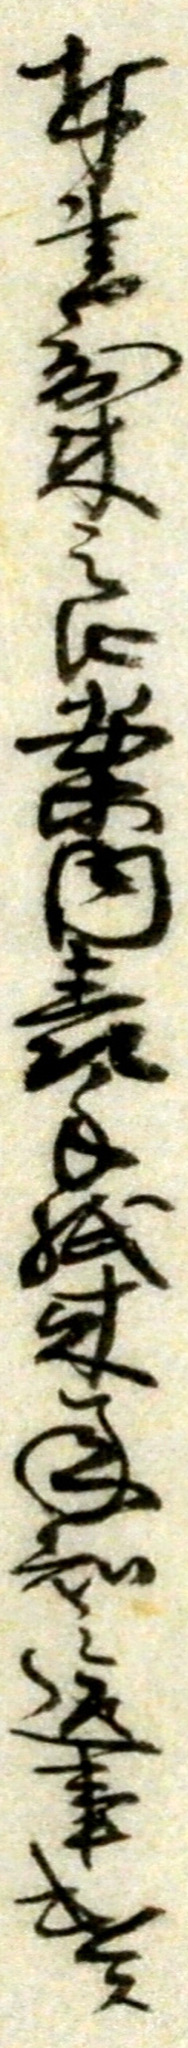奉書到来之由案内表手紙来年知之返事遣ㇲ
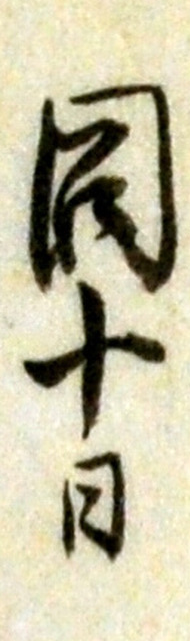同十日
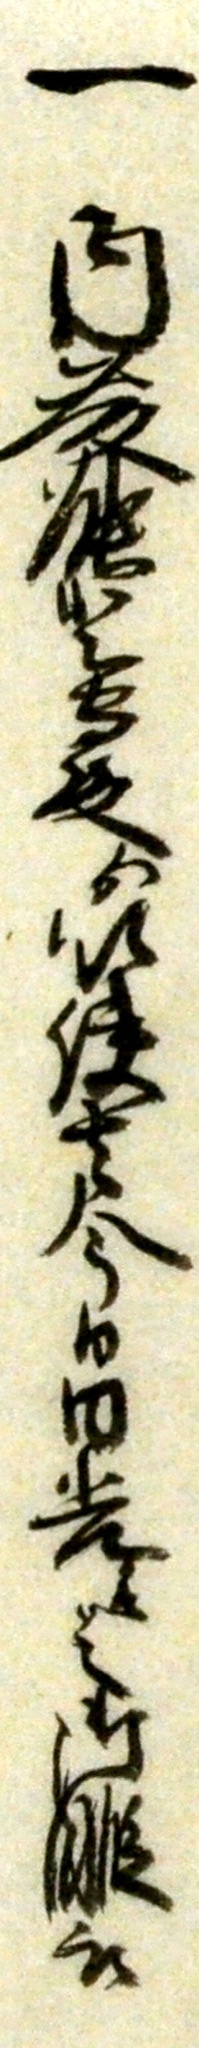一内藤能登守殿ゟ以使者今日日光江之御暇被
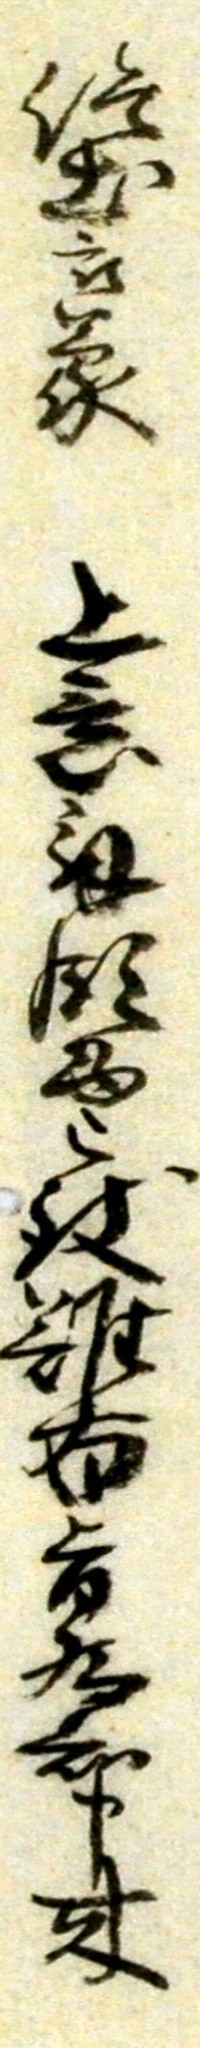仰出被蒙上意拝領品被致難有旨為知申来
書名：日光御名代相勤候節ノ留
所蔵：伊那市立高遠町図書館・合同会社AMANE
